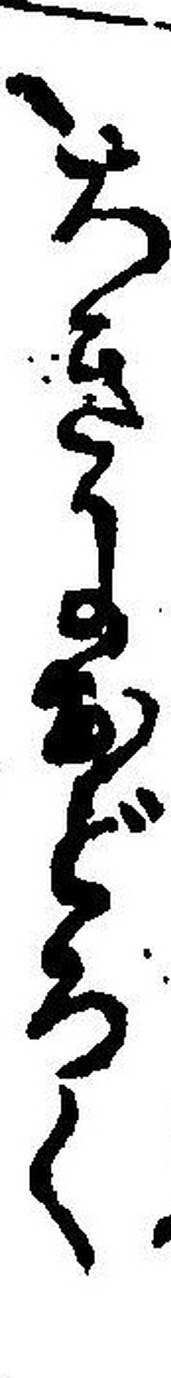大きにおどろく
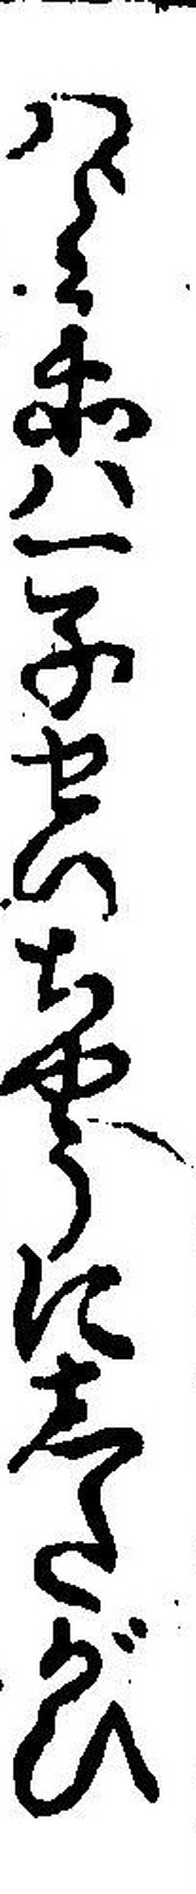八郎兵衛は一子せいちやうにしたがひ
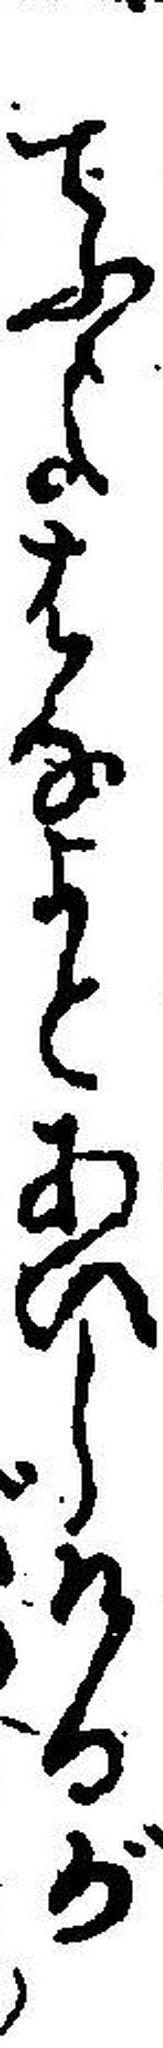てふよはなよとあいしけるが
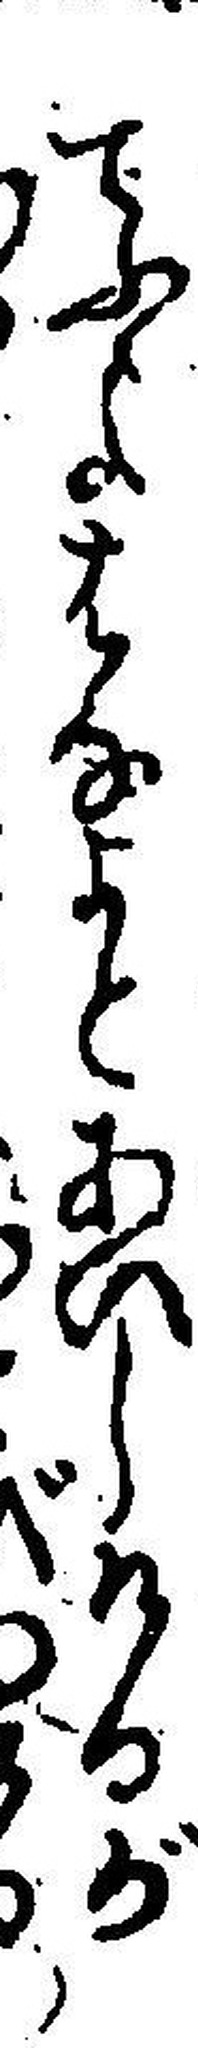てふよはなよとあいしけるが
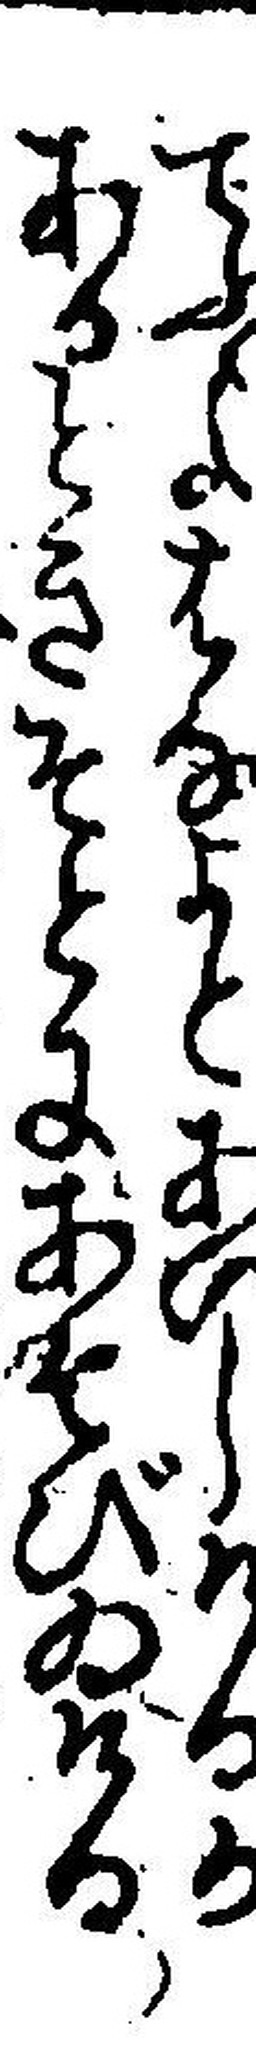あるときそとにあそびゐける
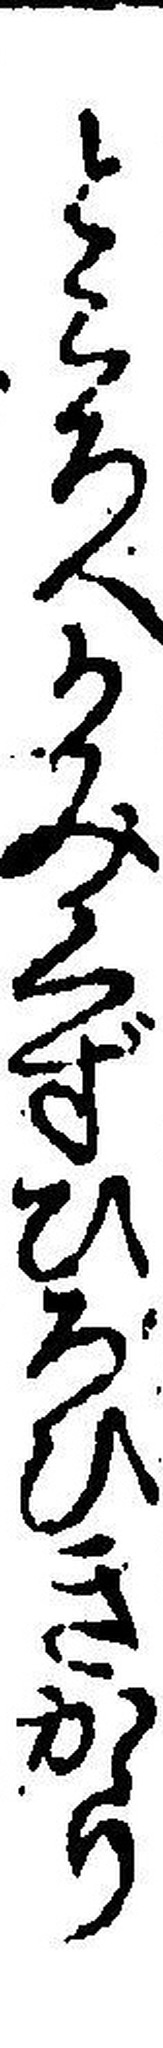ところへかみくずひろひきかゝり
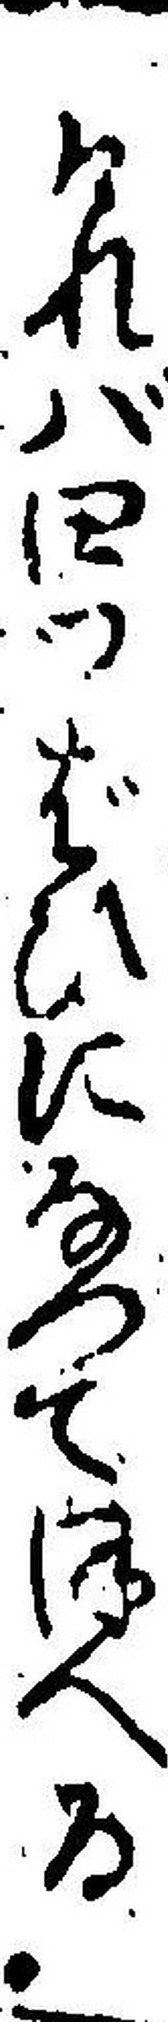ければ四つばひになつてほへる
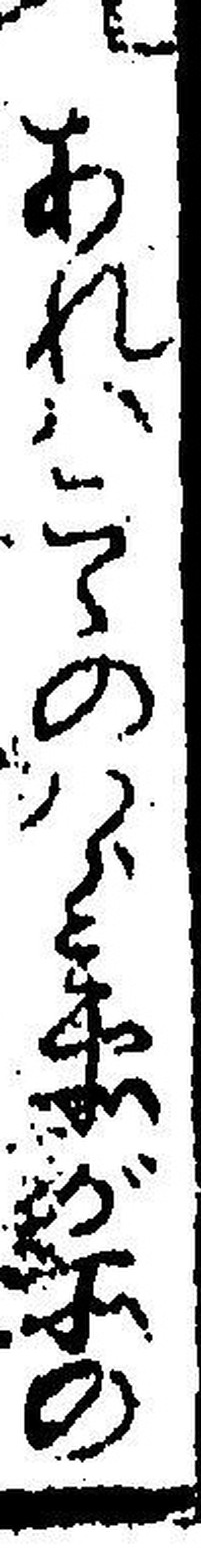あれはこゝの八郎兵衛が所の
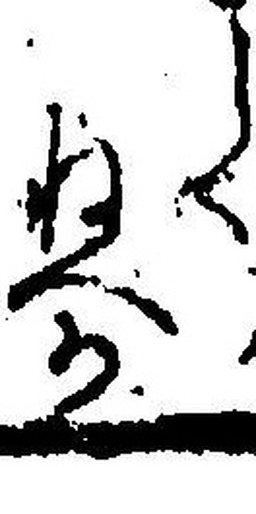ねへか
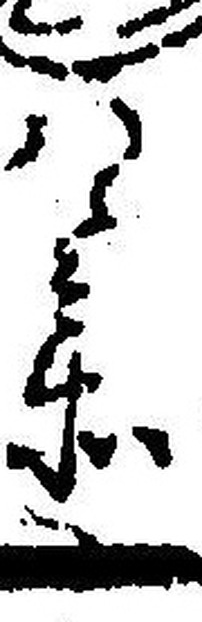八郎兵衛
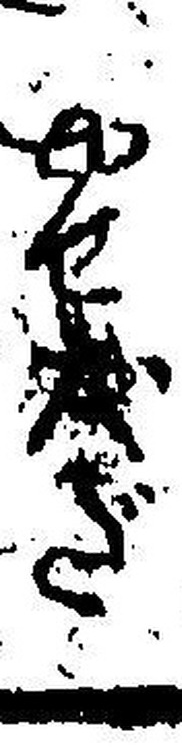やせ犬だ
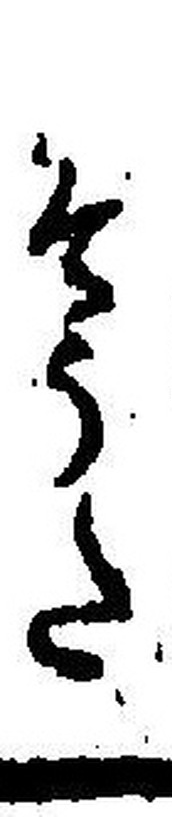そうた

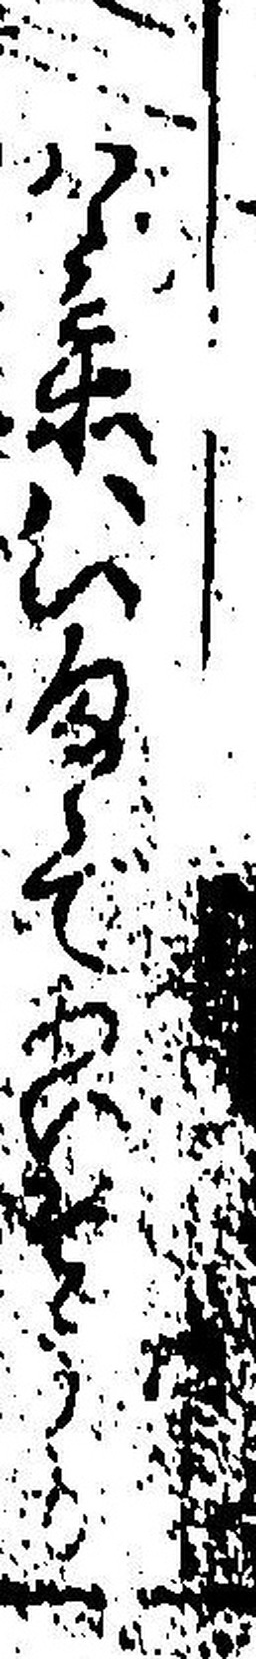八郎兵衛はいまゝであいそうも
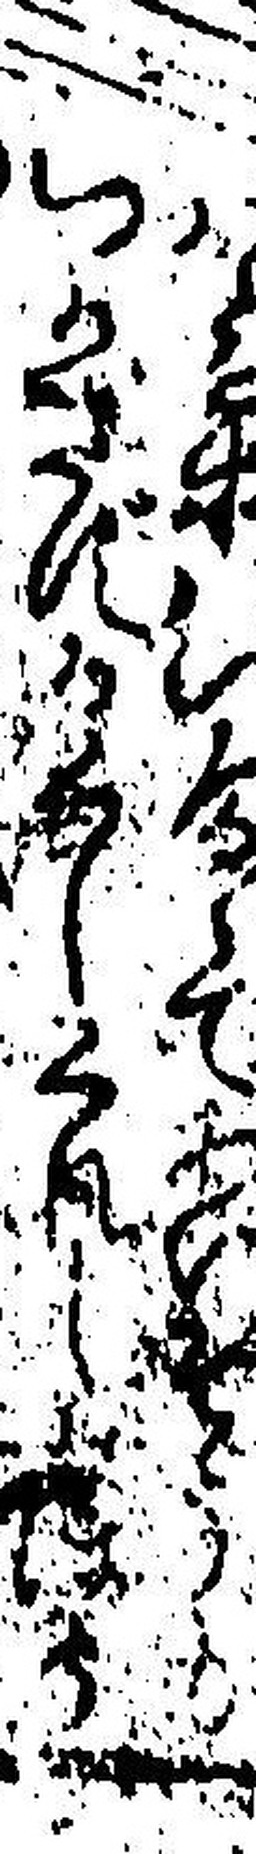つかさずかくしくれしう
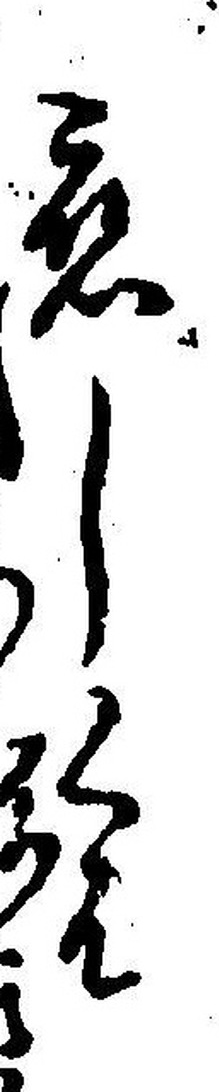恋しくは
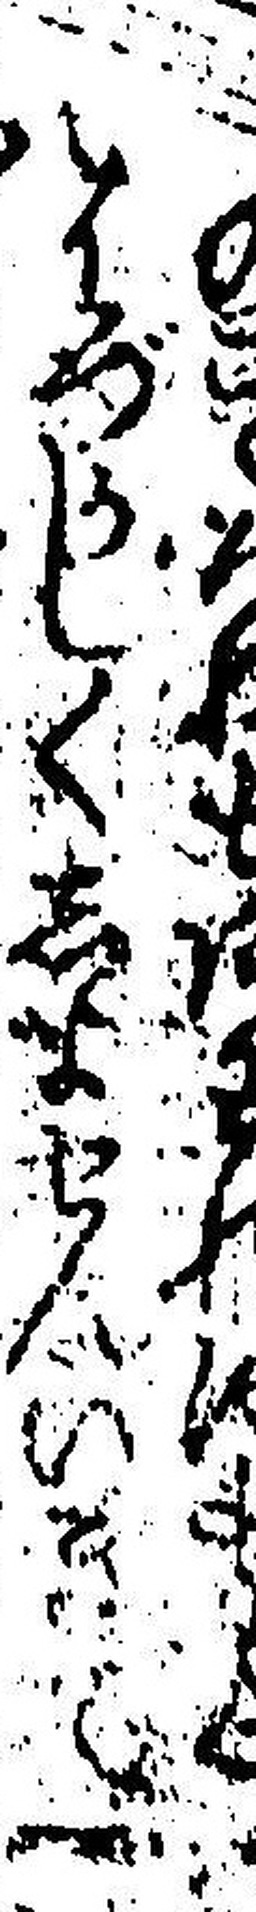はづかしくしよせんいきて
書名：花芳野犬斑 / 山東京伝作
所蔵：東京大学総合図書館 General Library in the University of Tokyo, JAPAN
